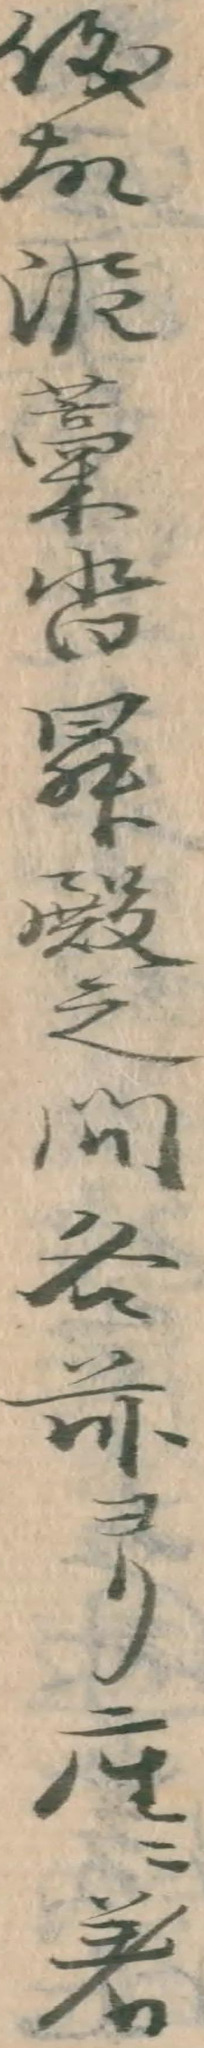儀故泥藁沓昇殿之間各前ヨリ座ニ着
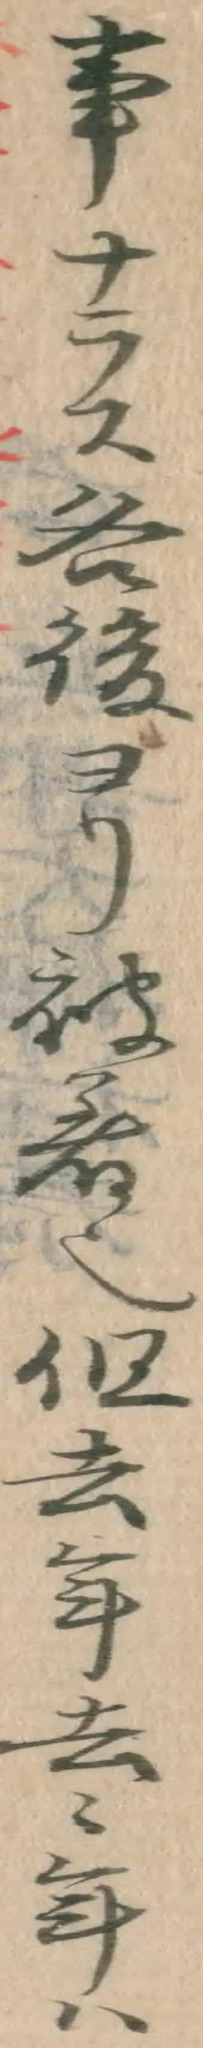事ナラス各後ヨリ被着也但去年去々年ハ
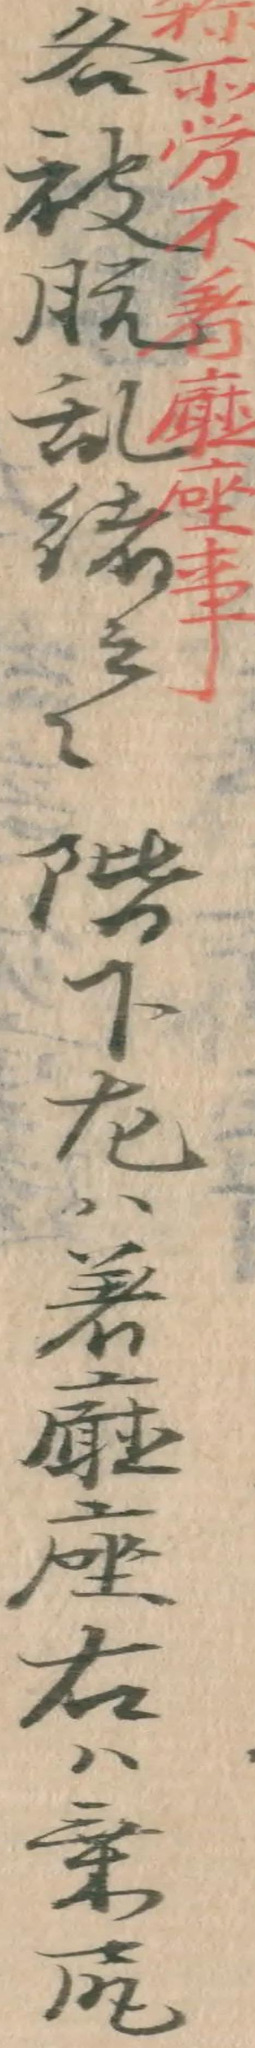各被脱乱緒云々階下左ハ着庁座右ハ乗尻
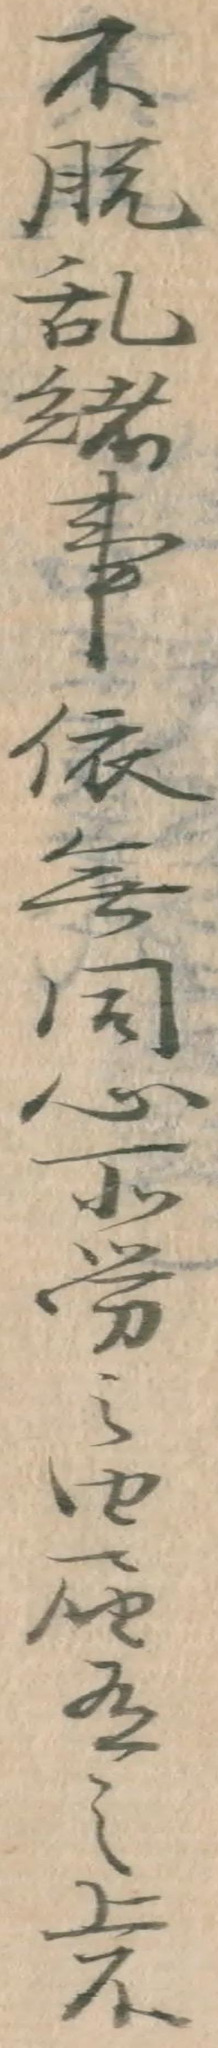不脱乱緒事依無同心所労之由届有之上不
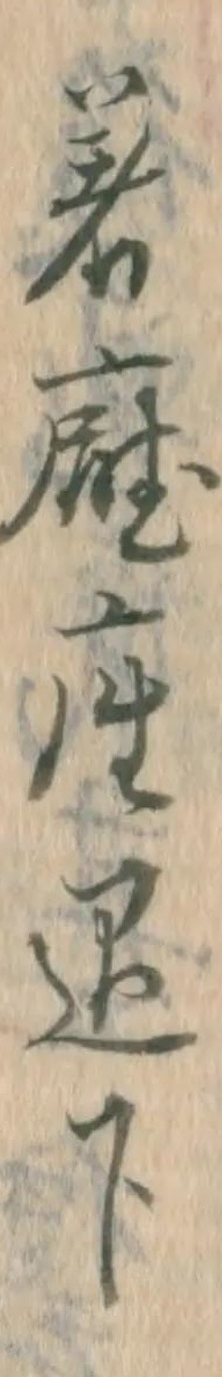着庁座退下
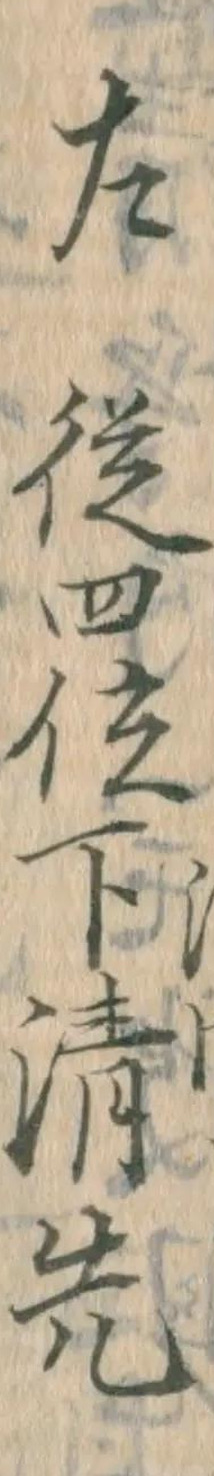左従四位下清先
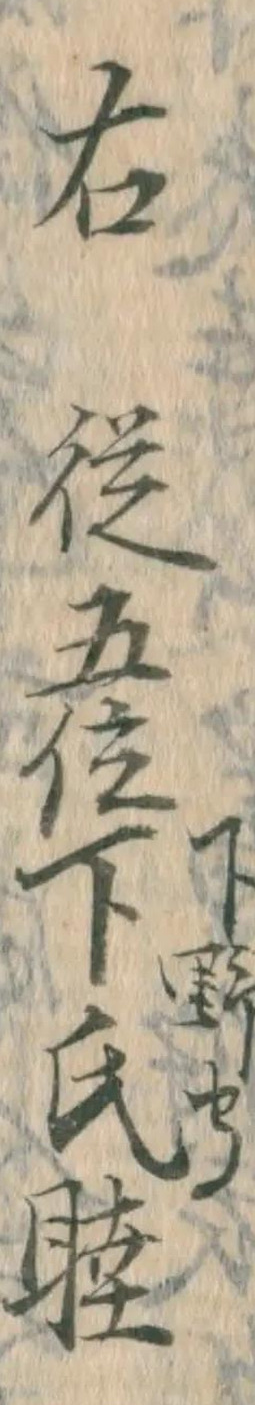右従五位下氏睦
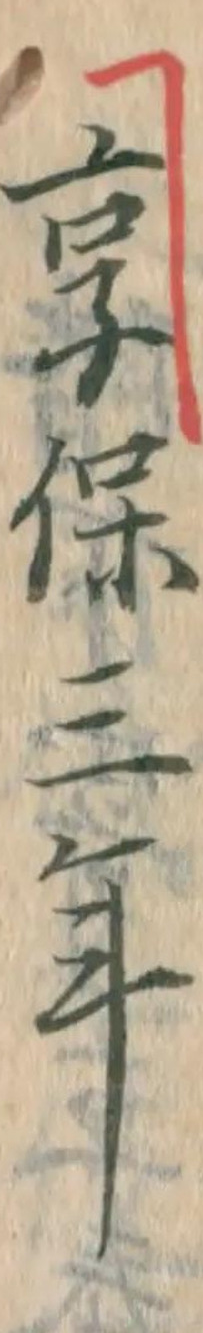享保三年
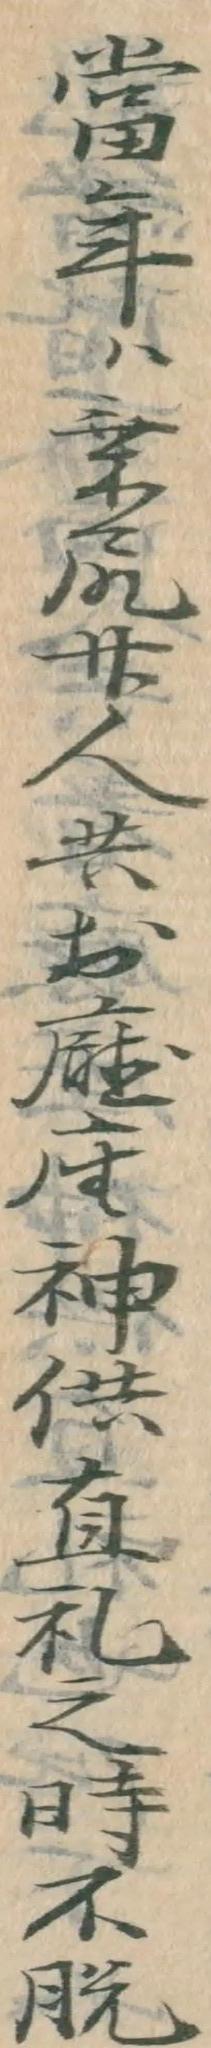当年ハ乗尻廿人共於庁座神供直礼之時不脱

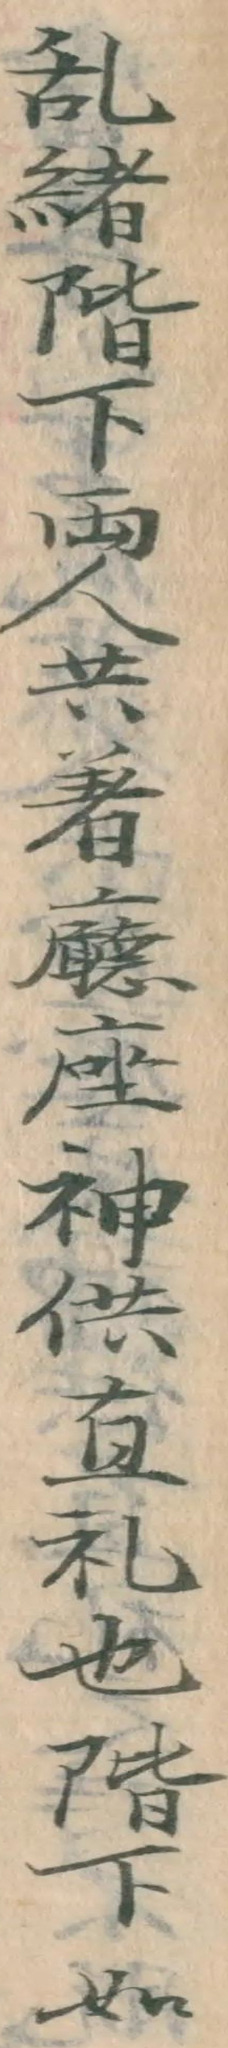乱緒階下両人共着庁座神供直礼也階下如
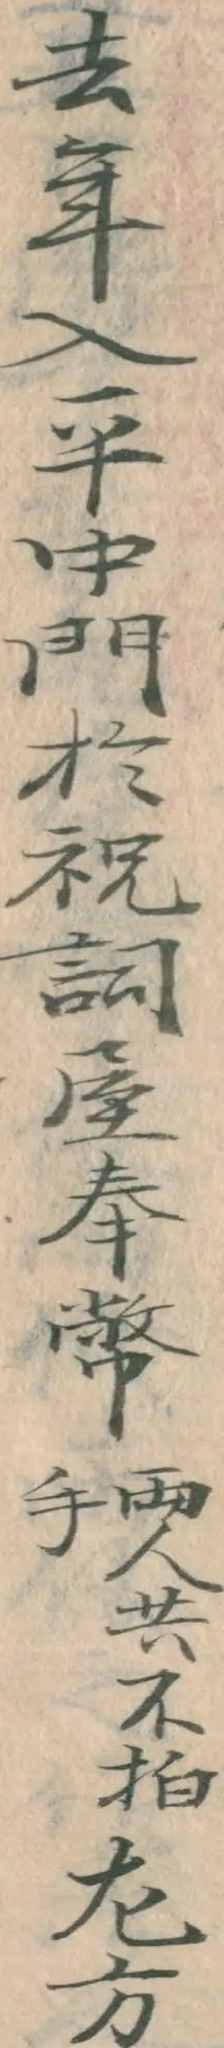去年入平中門於祝詞屋奉幣両人共不拍手左方
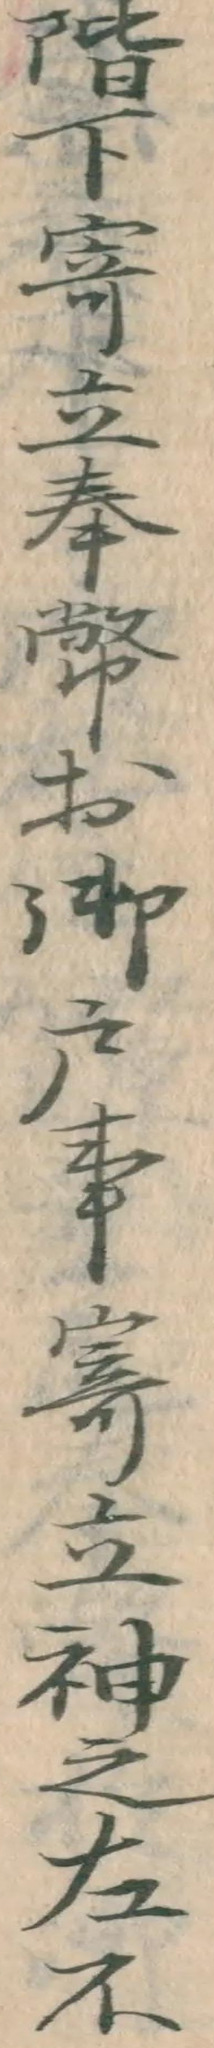階下寄立奉幣於御戸事寄立神之左不
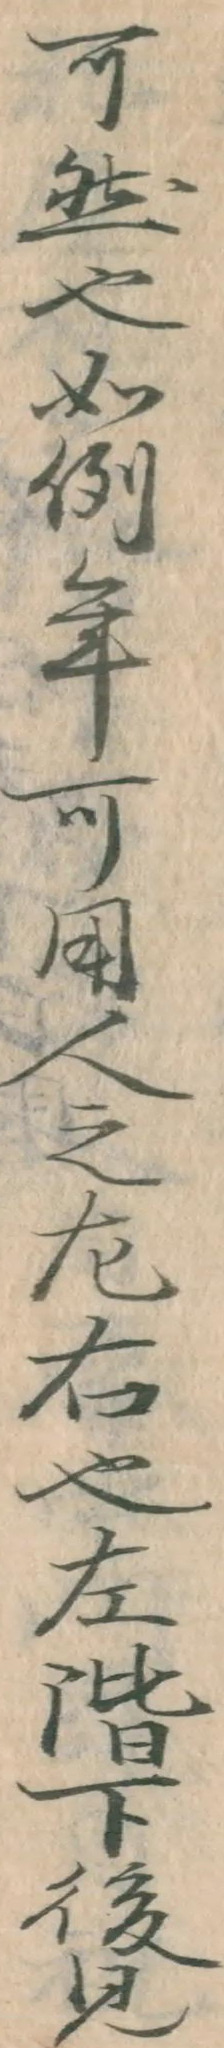可然也如例年可用人之左右也左階下後見
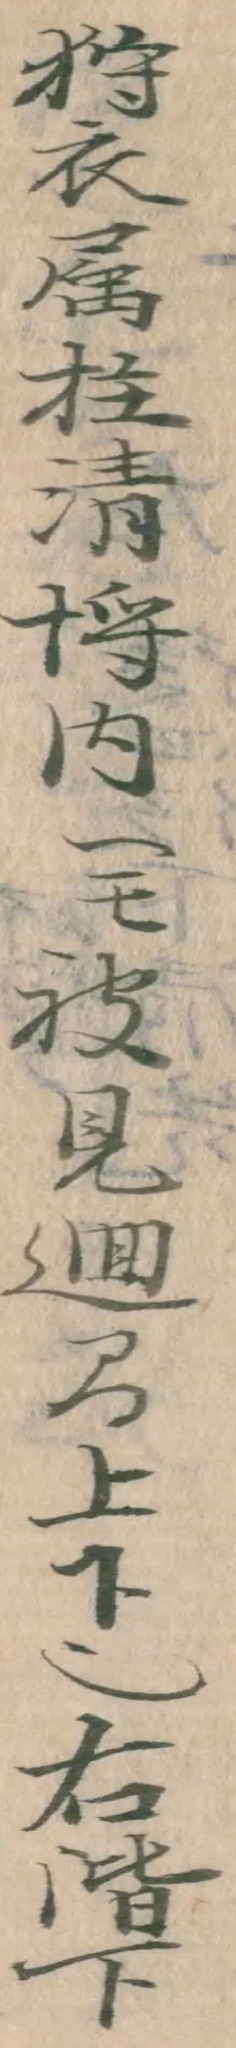狩衣属柱清埒内ヘモ被見廻間上下也右階下
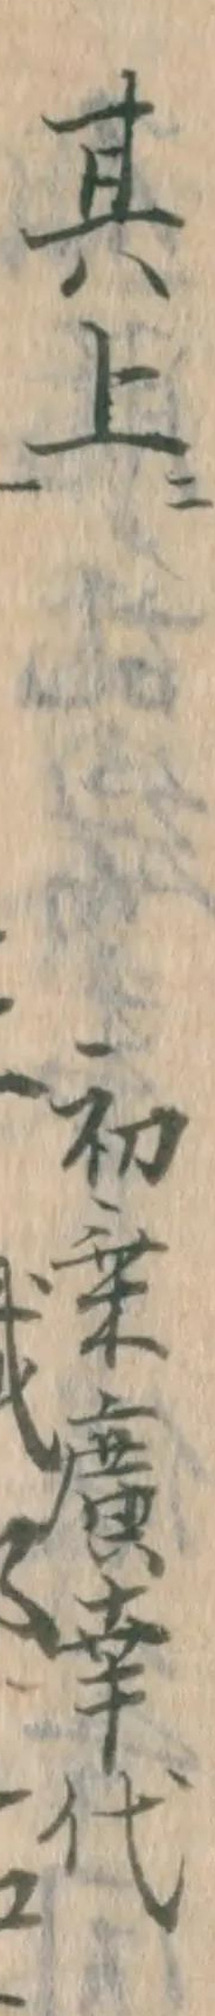初乗広幸代
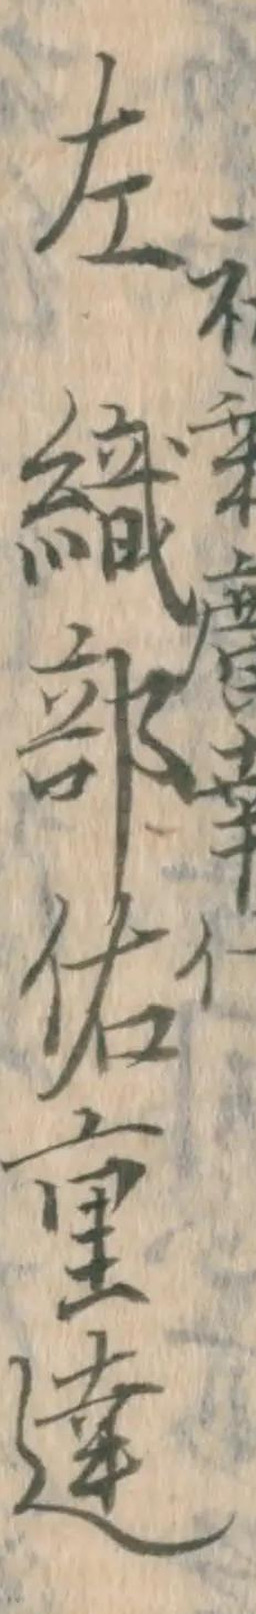左織部佑重達
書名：賀茂社記録. 第10冊
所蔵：国立国会図書館 National Diet Library, JAPAN
